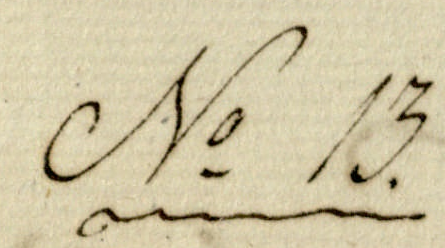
No 13.
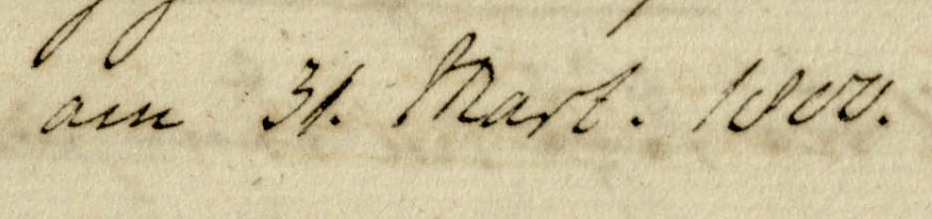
am 31. Mart. 1800.
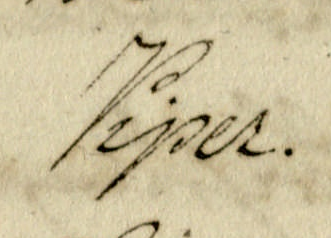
Piper.
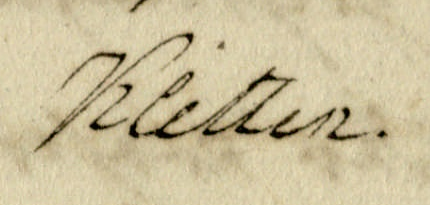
Kletten.
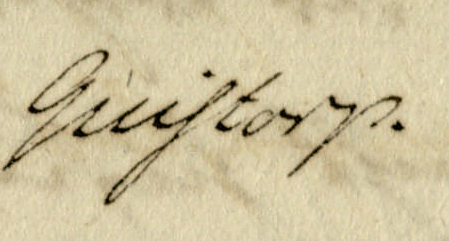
Quistorp.
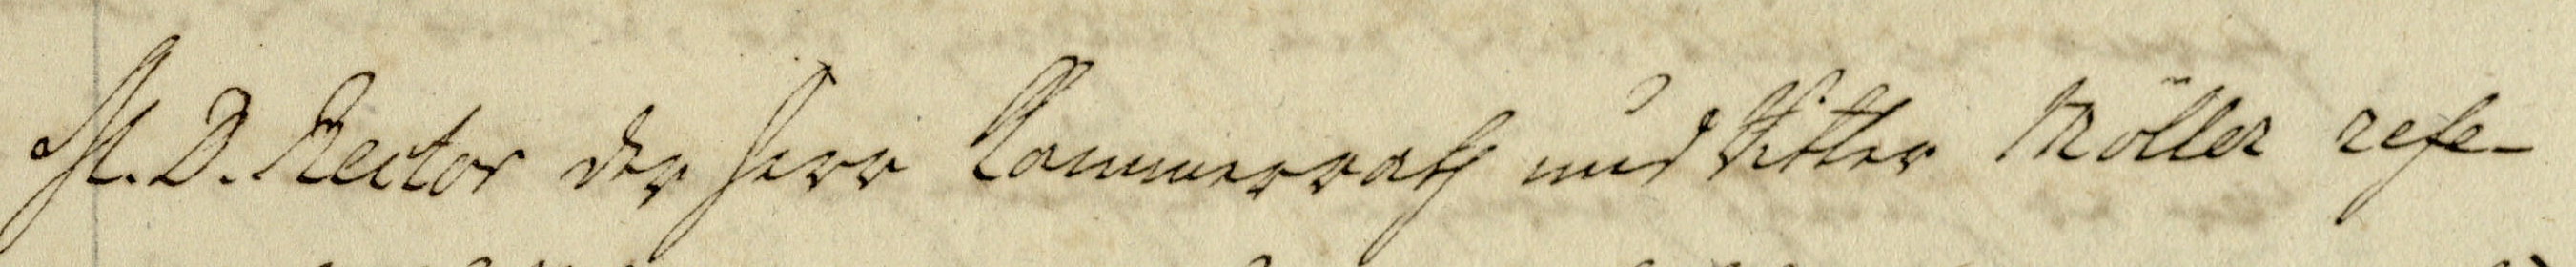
M. D. Rector der Herr Kammerrath und Ritter Möller refe¬
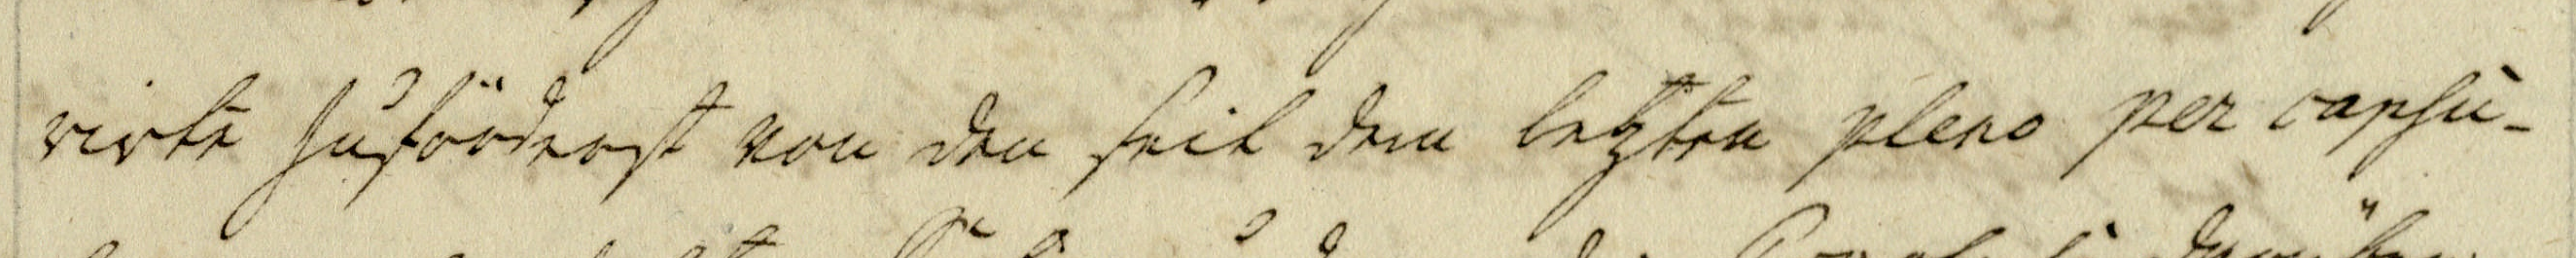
rirte zuförderst von den seit dem letzten pleno per capsu¬
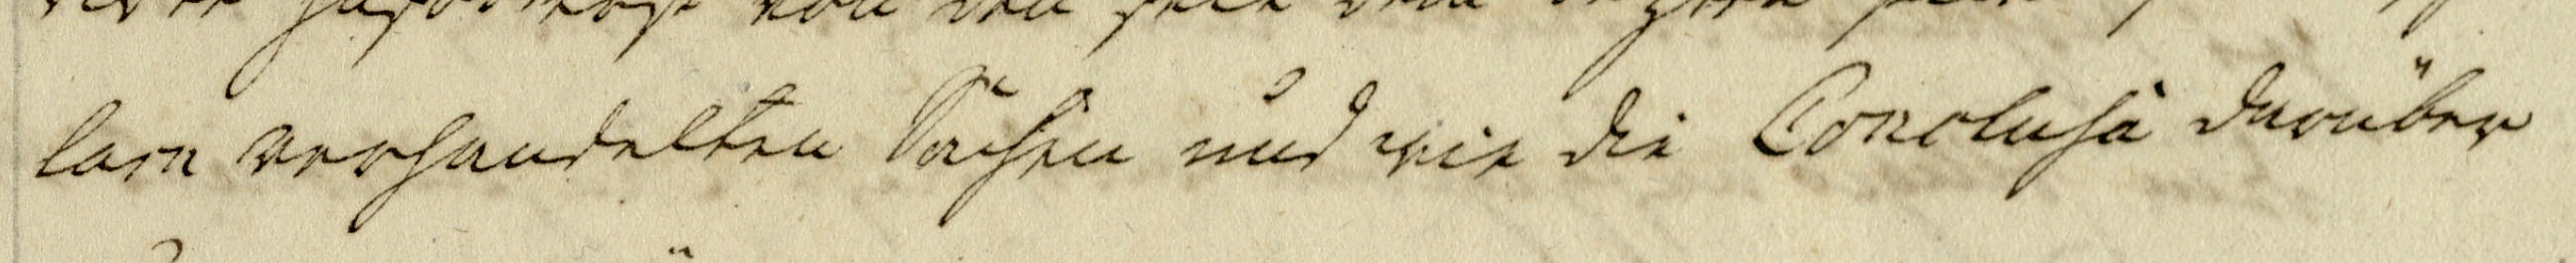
lam verhandelten Sachen und wie die Conclusa darüber
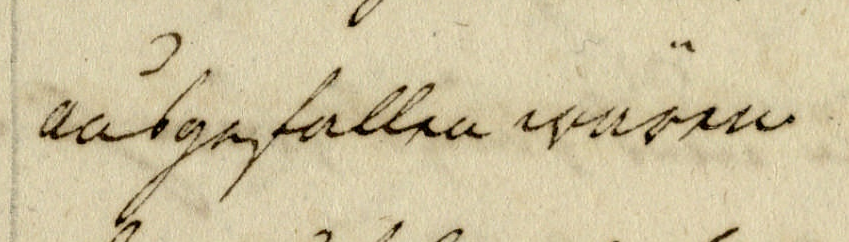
ausgefallen wären.
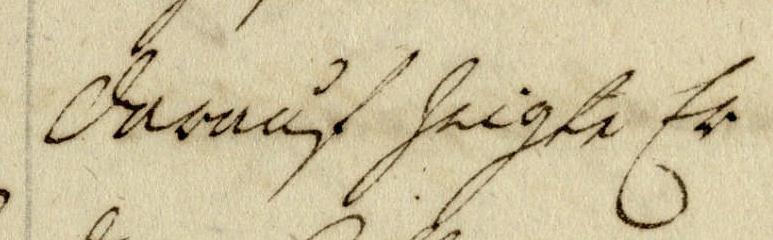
Darauf zeigte Er
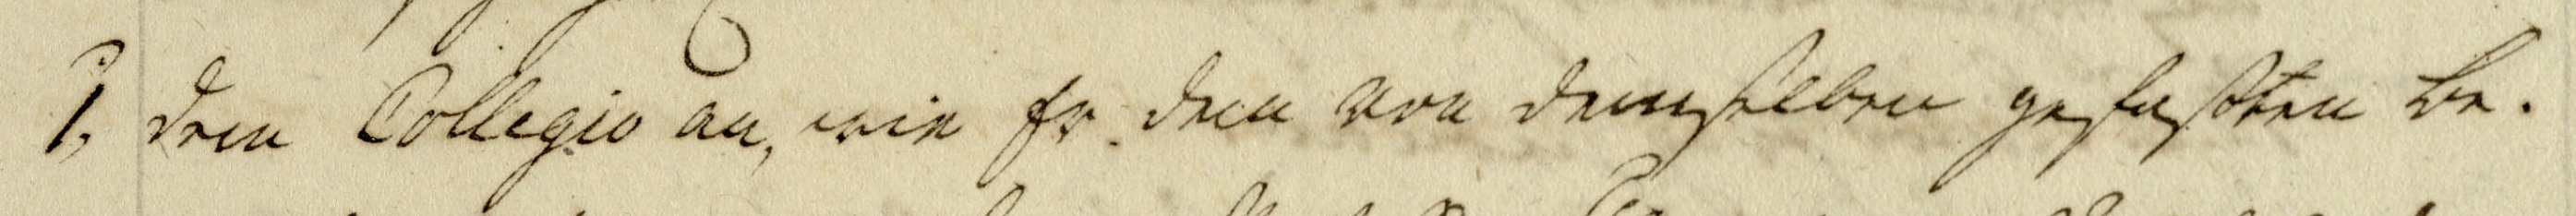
1. dem Collegio an, wie Er dem von demselben gefaßten Be¬
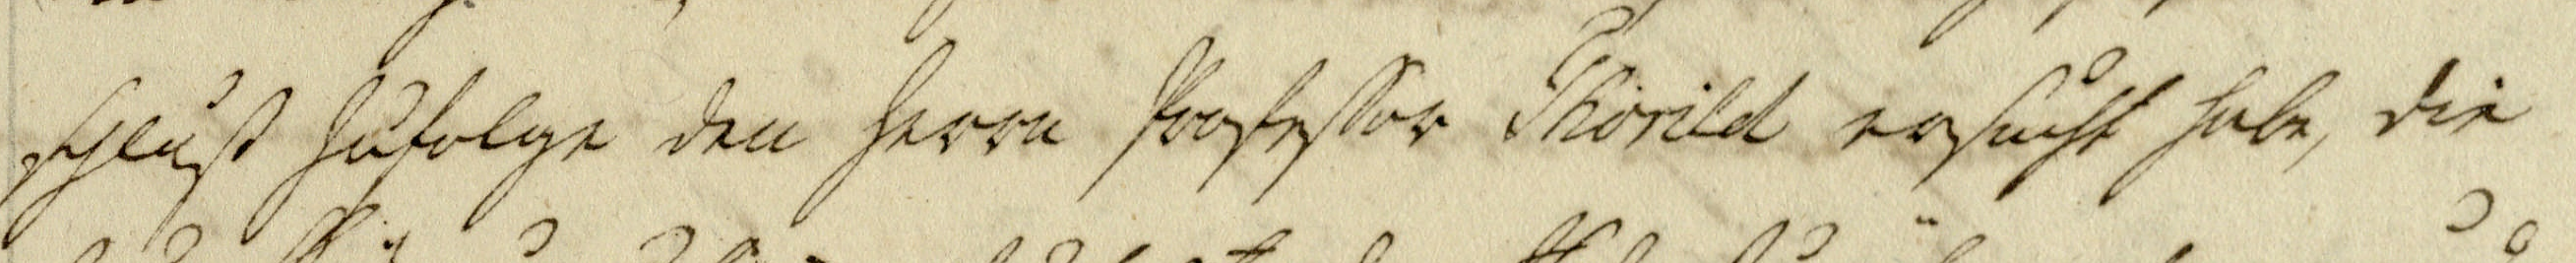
schluß zufolge den Herrn Professor Thorild ersucht habe, die
